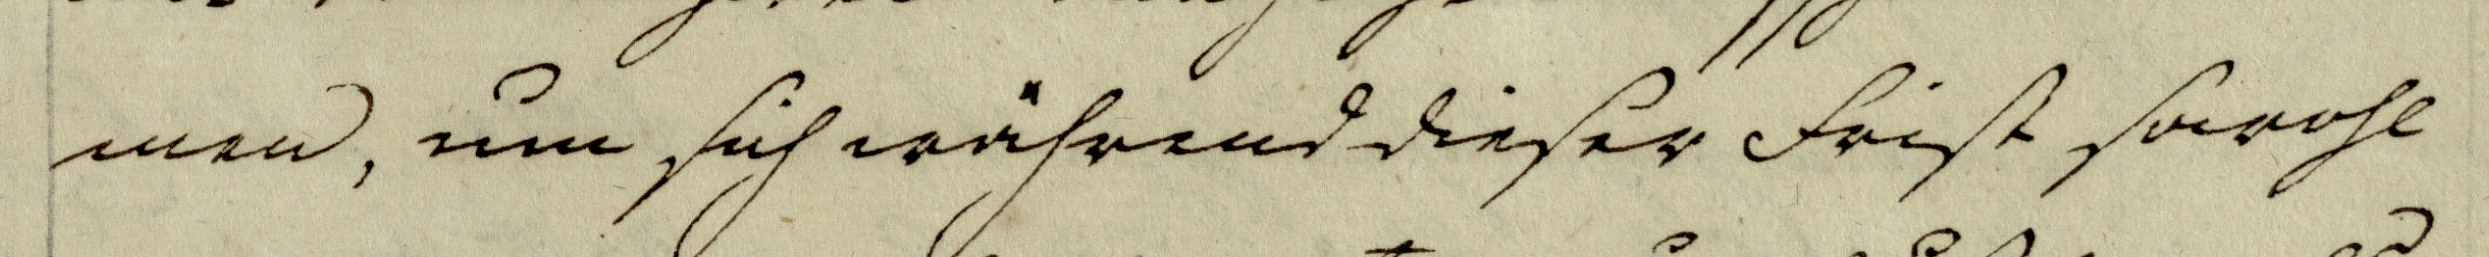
men, um sich während dieser Frist sowohl
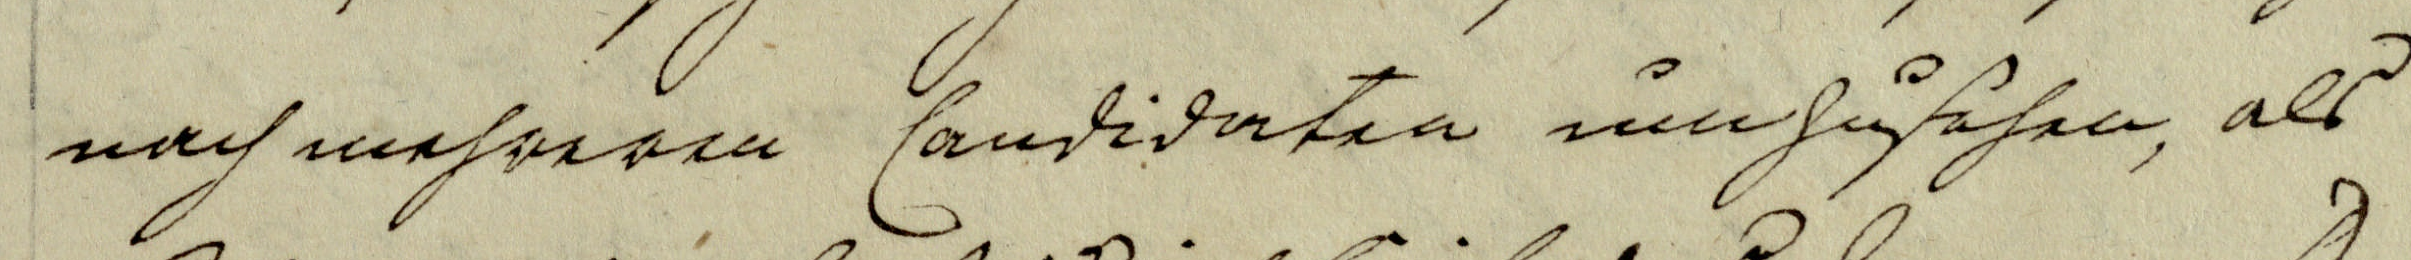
nach mehreren Candidaten umzusehen, als
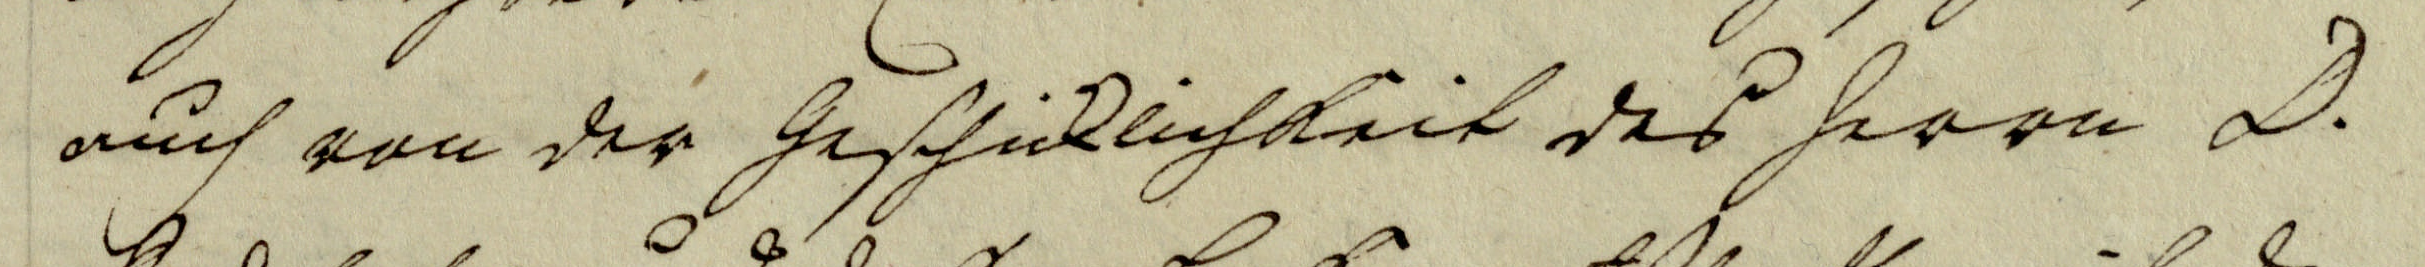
auch von der Geschicklichkeit des Herrn D.
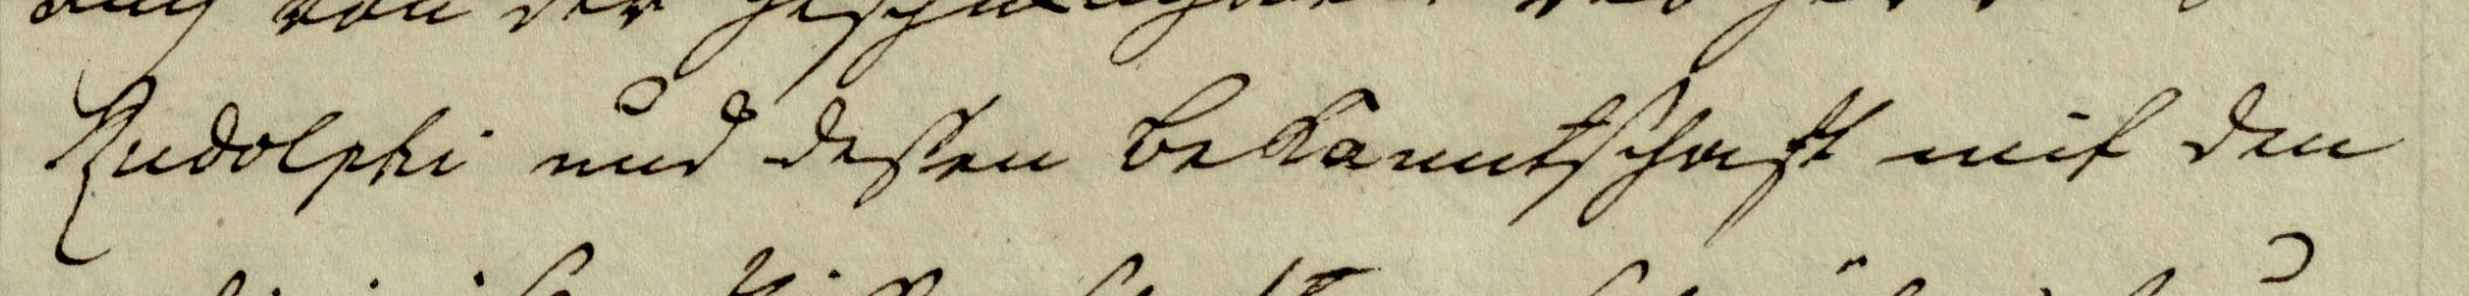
Rudolphi und dessen Bekanntschaft mit den
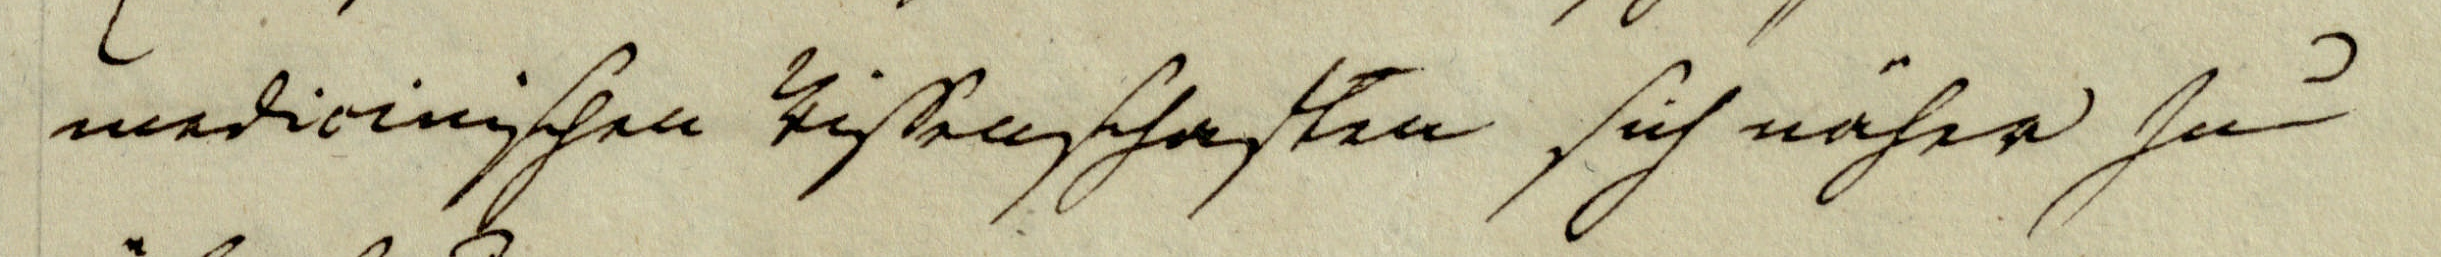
medicinischen Wissenschaften sich näher zu
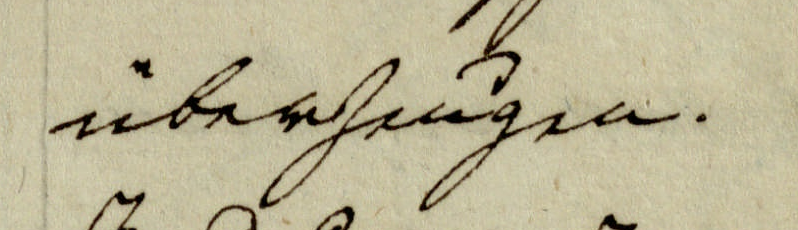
überzeugen.
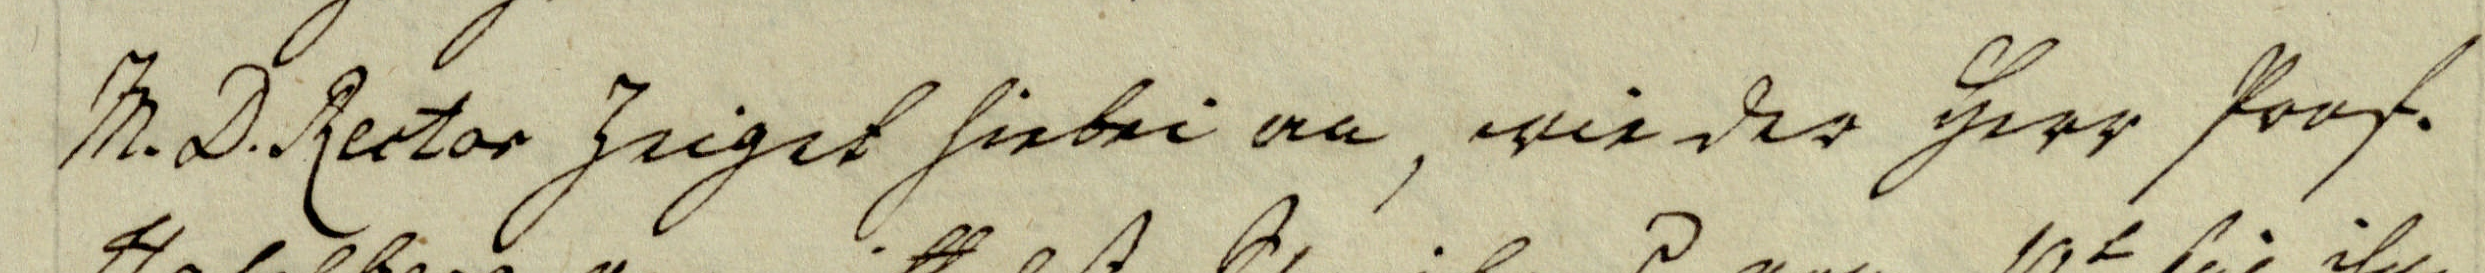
M. D. Rector zeiget hiebei an, wie der Herr Prof.
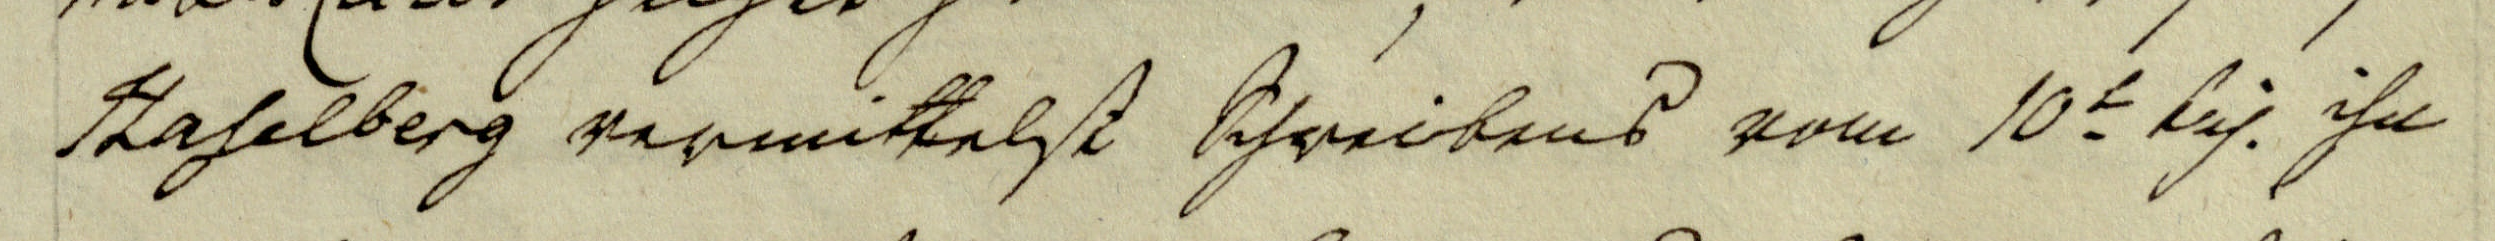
Haselberg vermittelst Schreibens vom 10 t huj. ihn
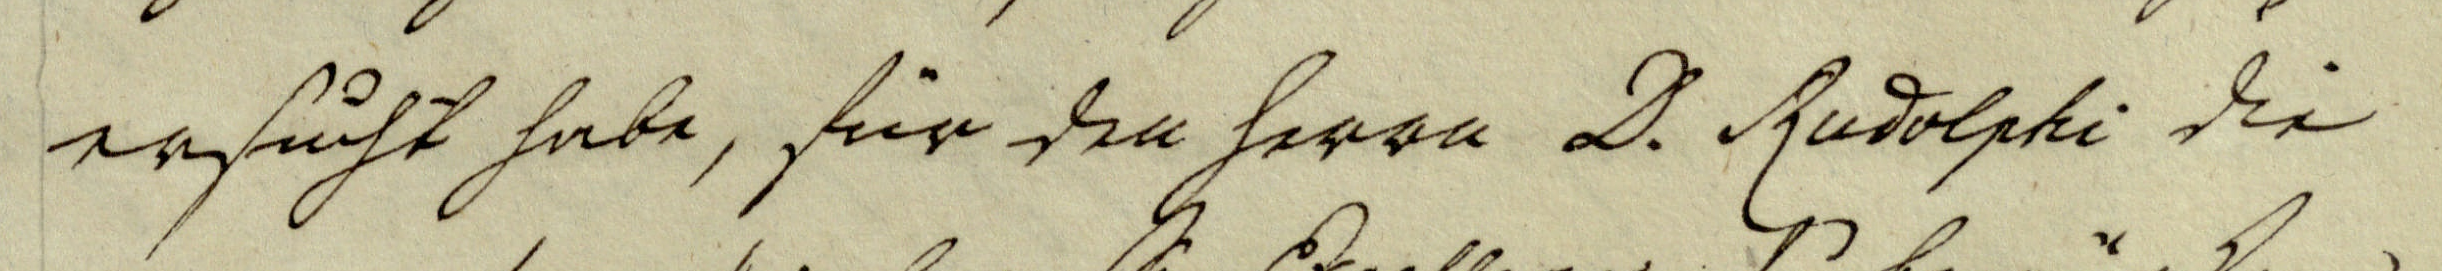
ersucht habe, für den Herrn D. Rudolphi die
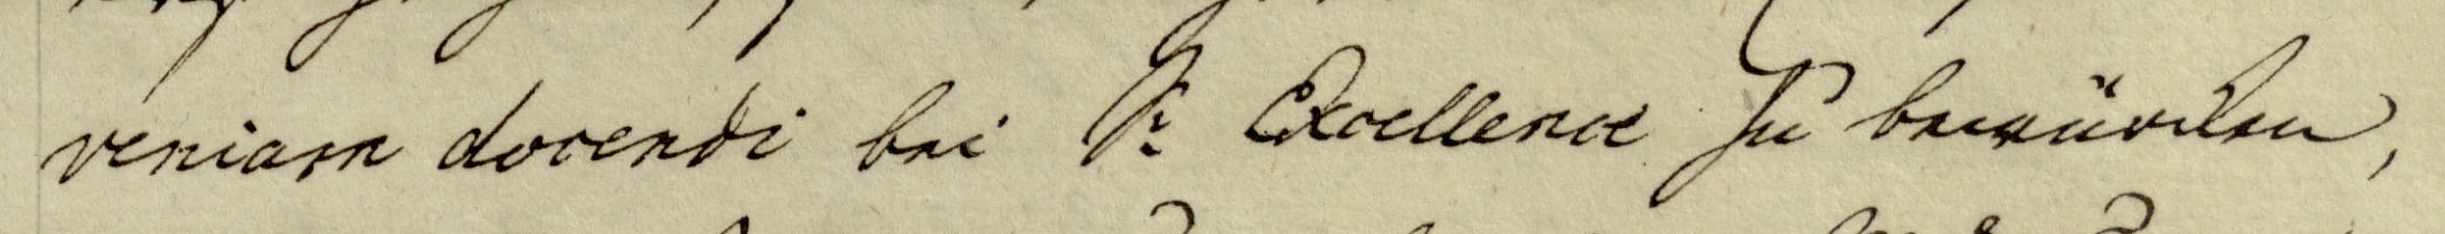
veniam docendi bei Sr Excellence zu bewürcken,
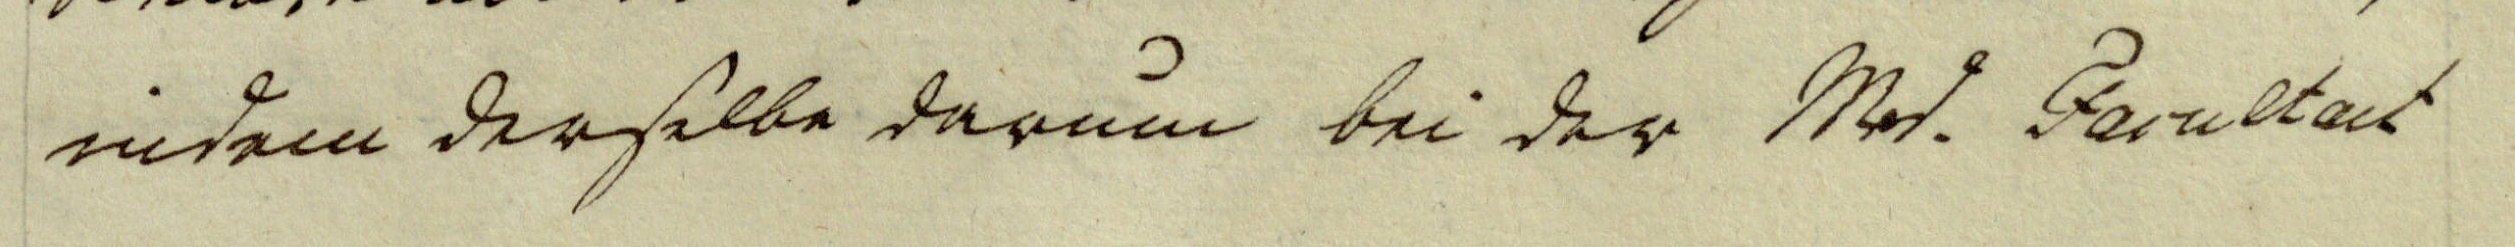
indem derselbe darum bei der Med. Facultaet
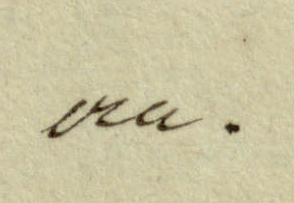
an¬
